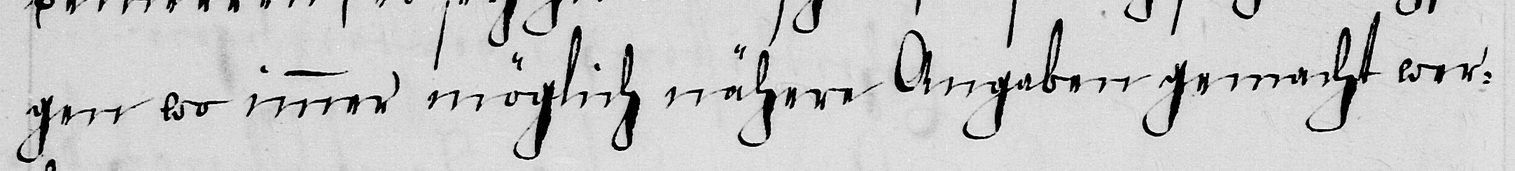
gen wo immer möglich nähere Angaben gemacht wer¬
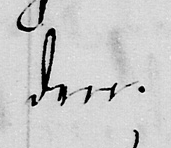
den.
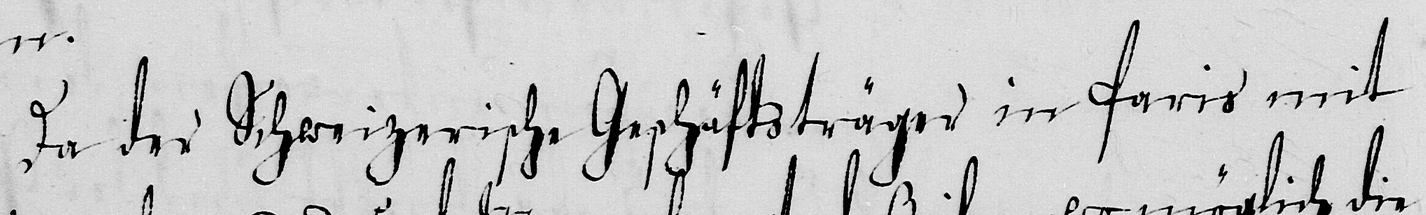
Da der Schweizerische Geschäftsträger in Paris mit
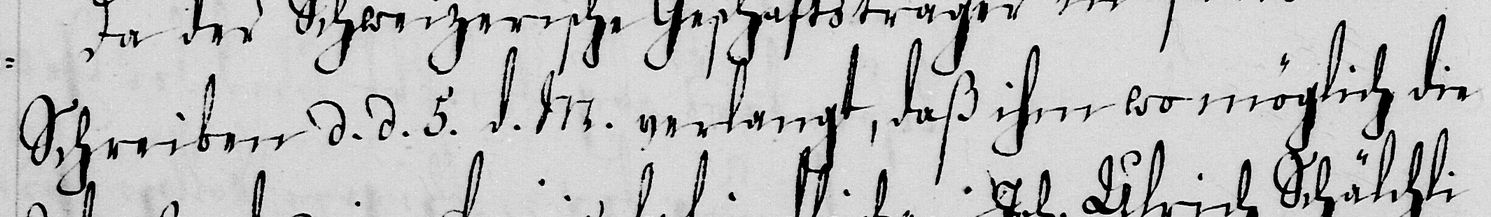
Schreiben d. d. 5. d. M. verlangt, daß ihm womöglich die
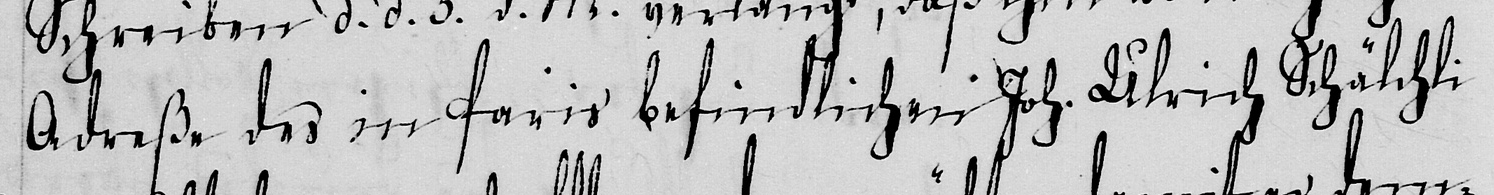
Adreße des in Paris befindlichen Joh. Ulrich Schälchli
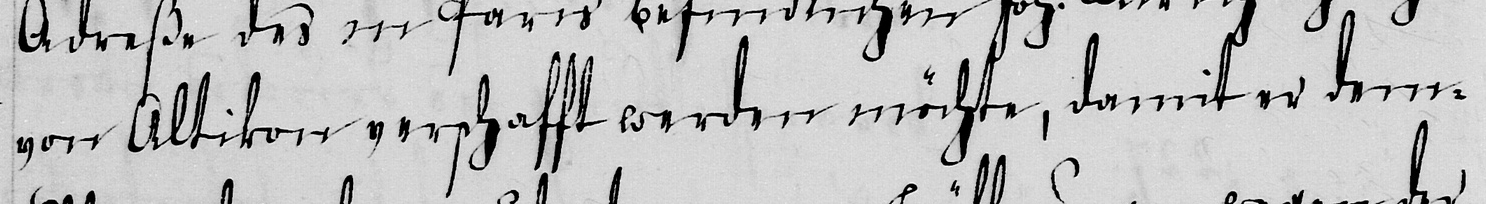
von Altikon verschafft werden möchte, damit er dem¬
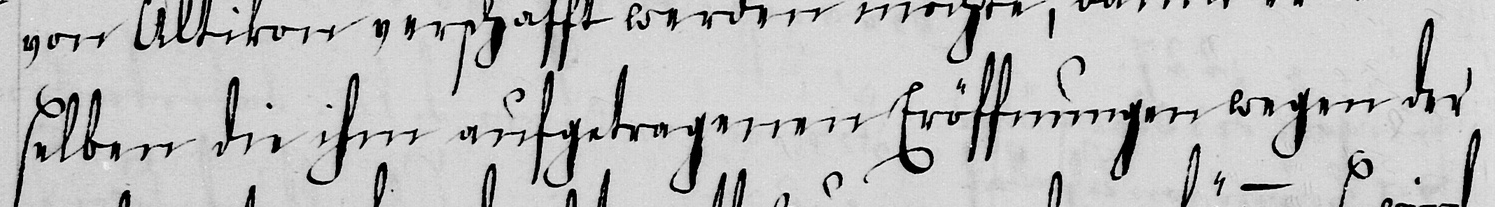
selben die ihm aufgetragenen Eröffnungen wegen der
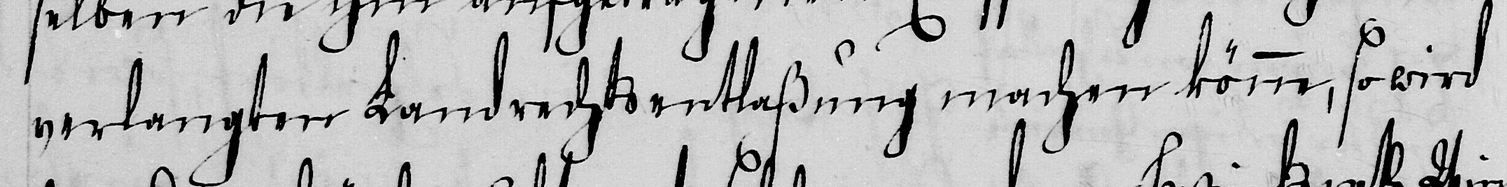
verlangten Landrechtsentlaßung machen könne, so wird
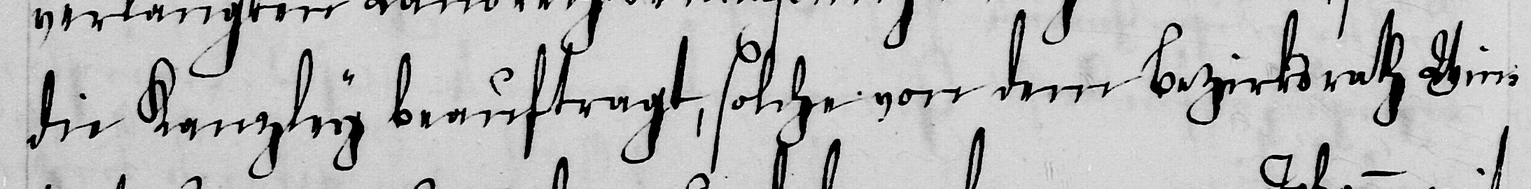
die Kanzley beauftragt, solche von dem Bezirksrath Win¬
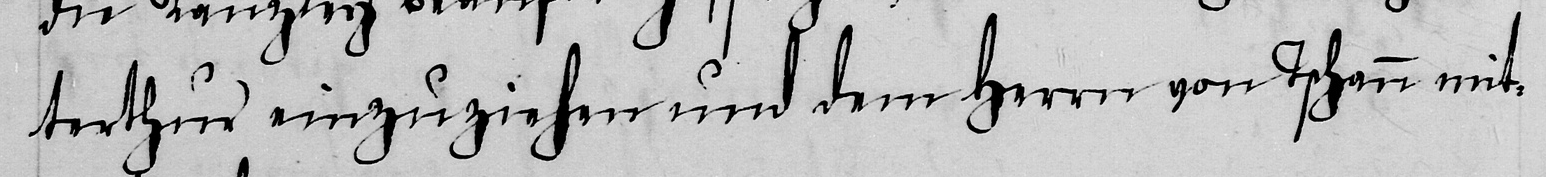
terthur einzuziehen und dem Herrn von Tschann mit¬
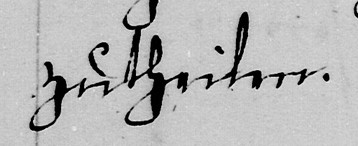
zutheilen.
